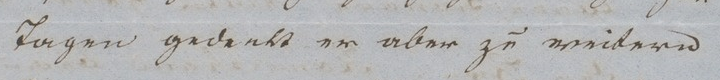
Tagen gedenkt er aber zu weitern
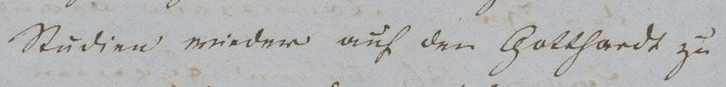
Studien wieder auf den Gotthardt zu
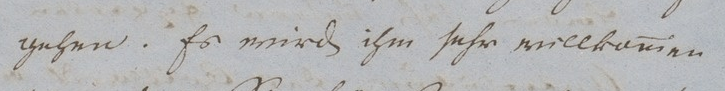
gehen. Es wird ihm sehr willkommen
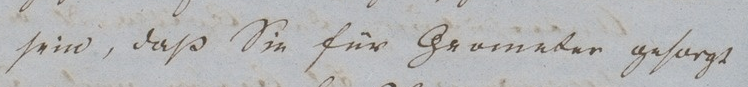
sein, daß Sie für Geometer gesorgt
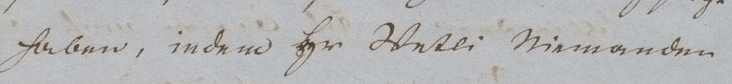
haben, indem Hr Wetli Niemanden
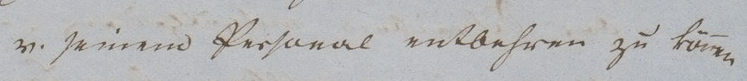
v. seinem Personal entbehren zu können
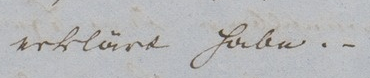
erklärt habe. –
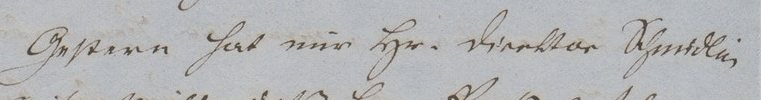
Gestern hat mir Hr. Direktor Schmidlin
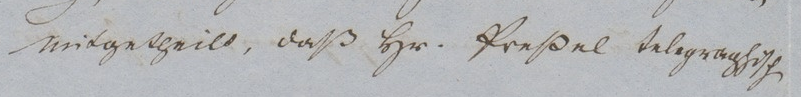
mitgetheilt, daß Hr. Preßel telegrafisch
